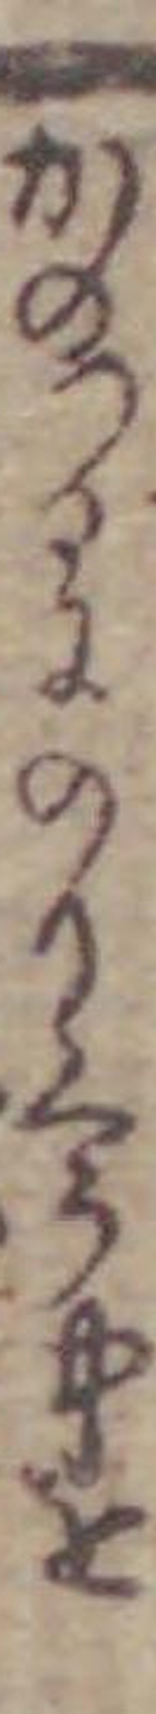かのつるにのりくう中を
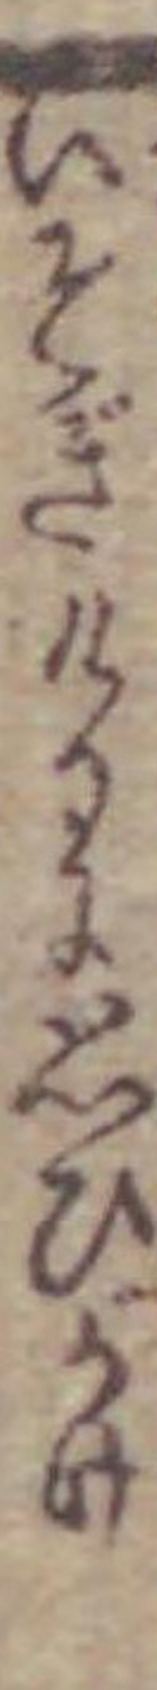いそぎけるに思ひがけ
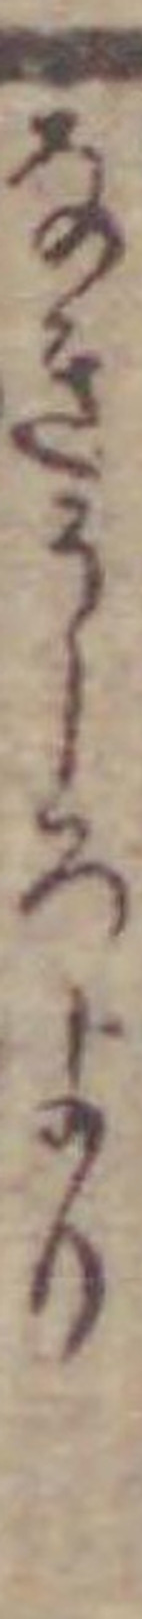なきうしろより
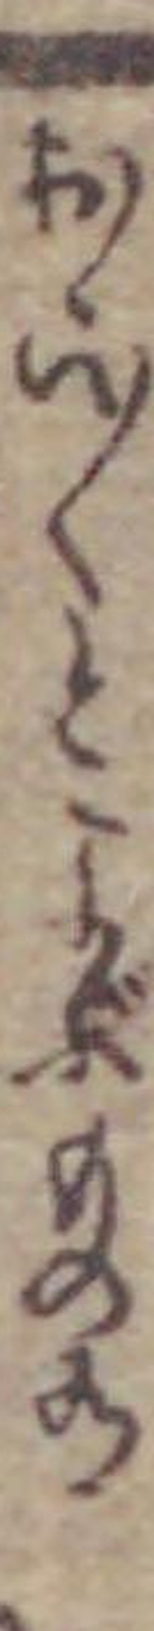おゝい〳〵とよぶもの有
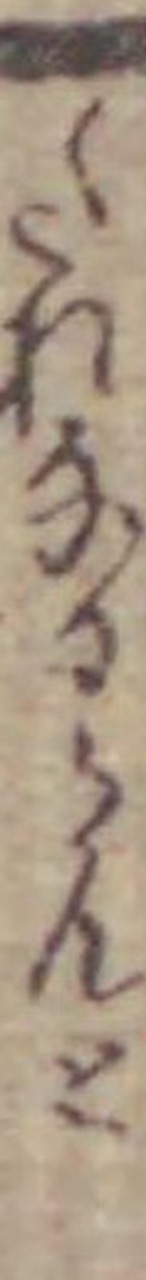たれなるらんと
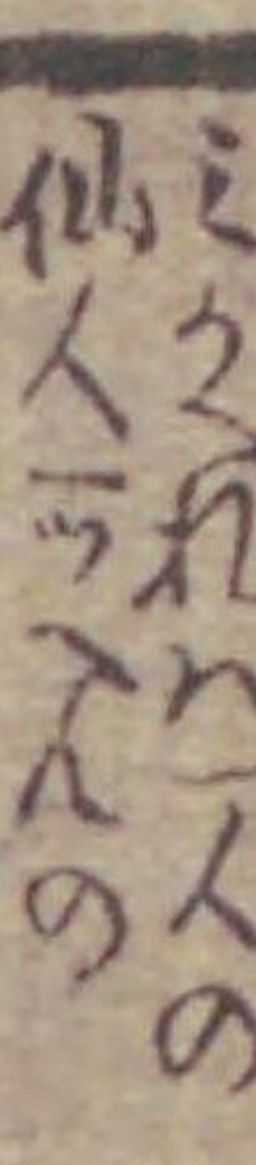仙人一つへんの
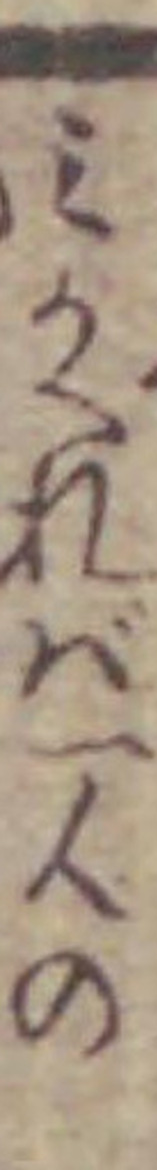みかへれば一人の
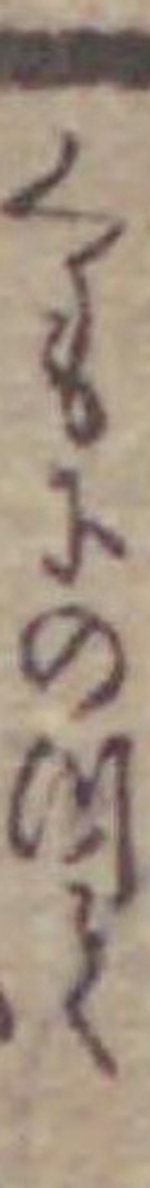くもにのつて
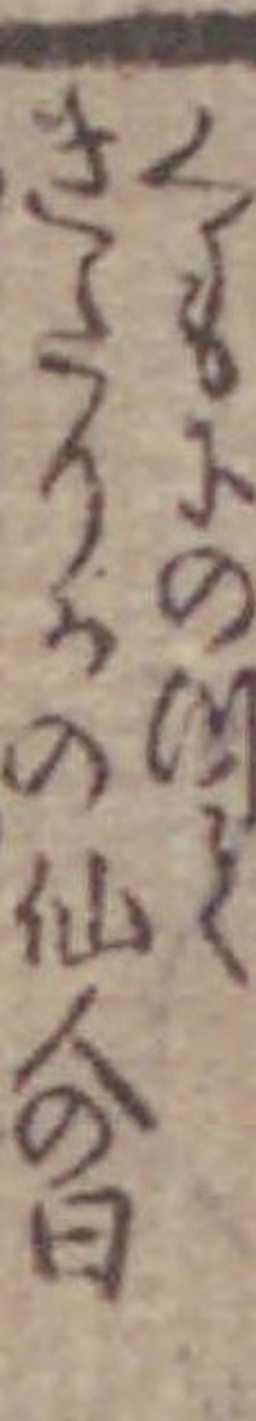きたりかの仙人の曰
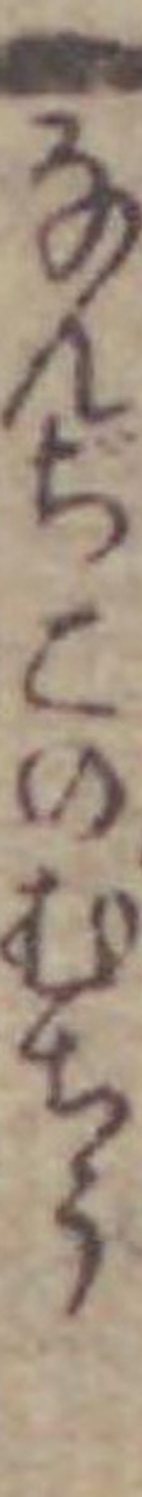なんぢこのむちう
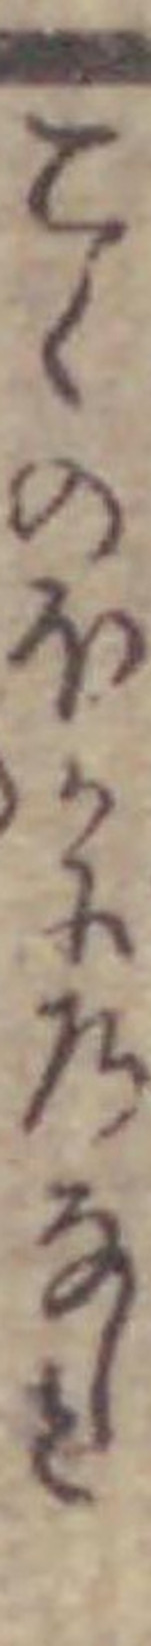こくのほかに道なしと
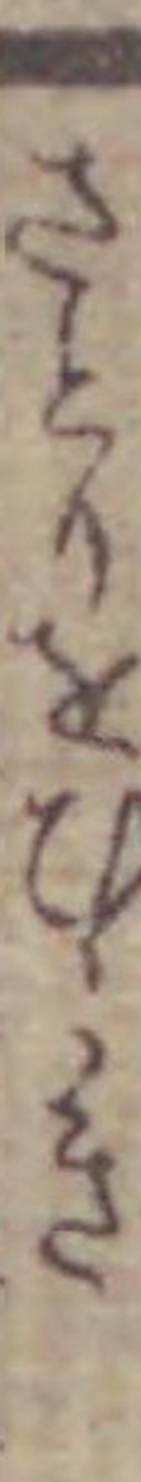さとりをひらき
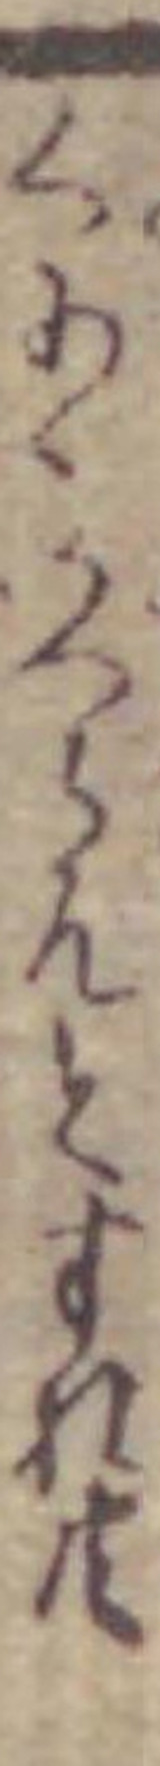くにゝかへらんとすれ共
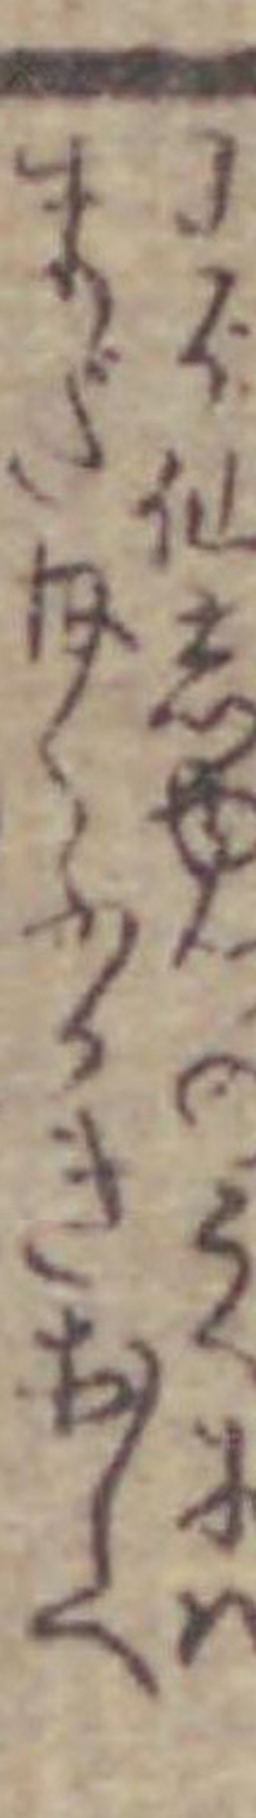まだおくふかきおしへ
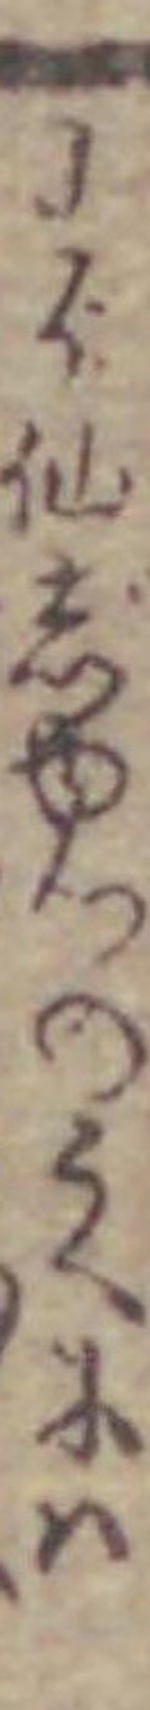わが仙じゆつのうへには
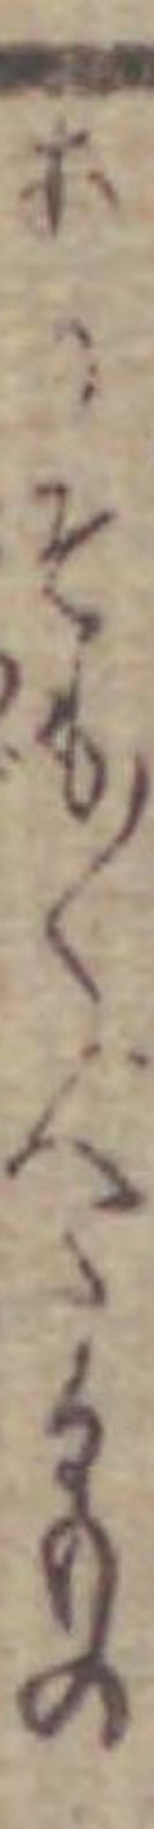ありそも〳〵人たるもの
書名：和荘兵衛後日話 : 3巻
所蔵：国立国会図書館 National Diet Library, JAPAN
